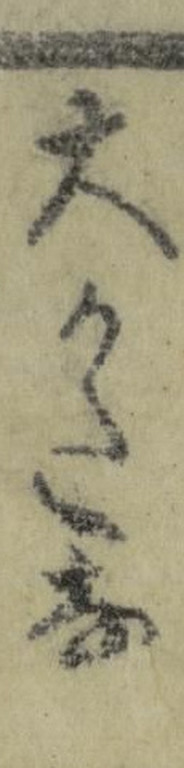大かたな
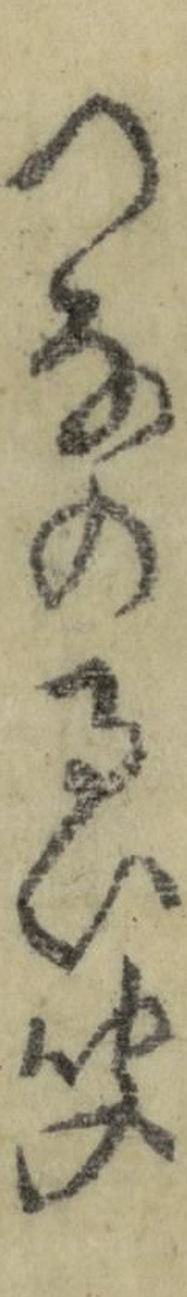つなのるひ聞
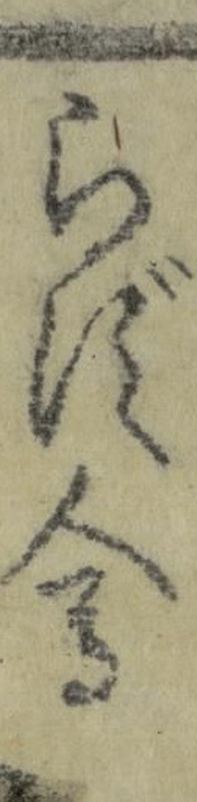らず人馬
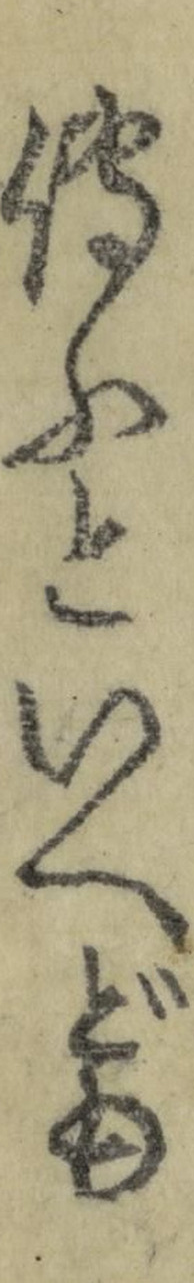伝ふといへども
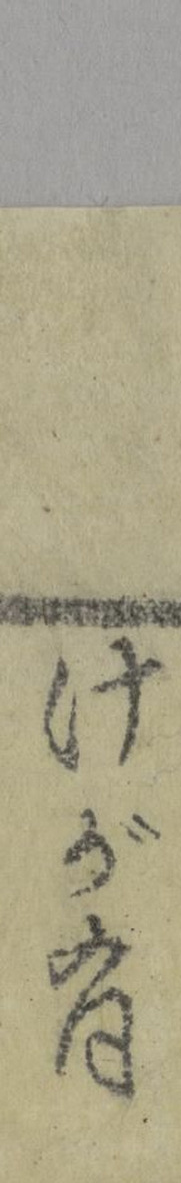けが有
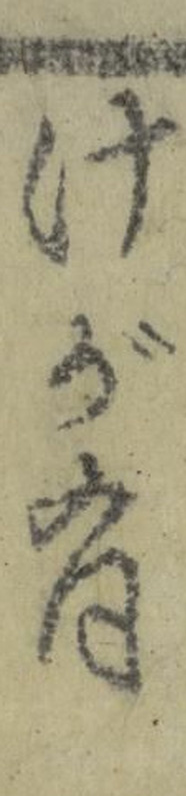けが有
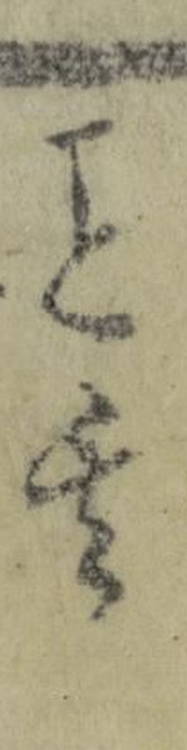こと其
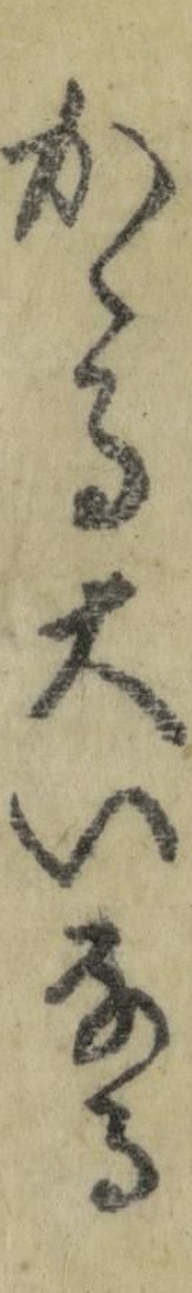かゝる大いなる
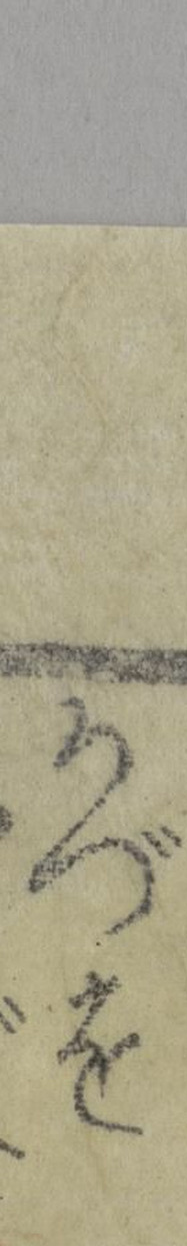かづを
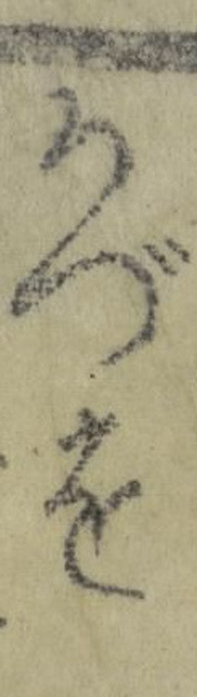かづを
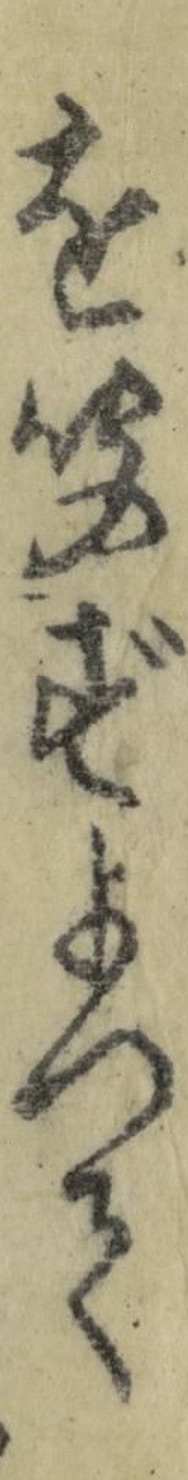を聞ずよつて
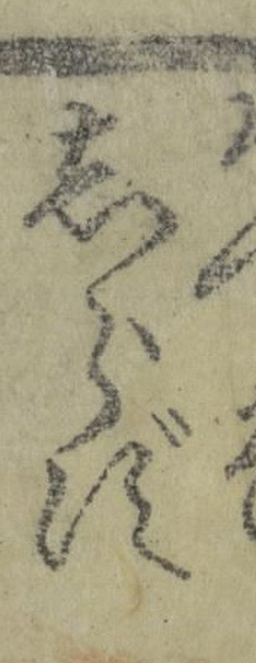しらず
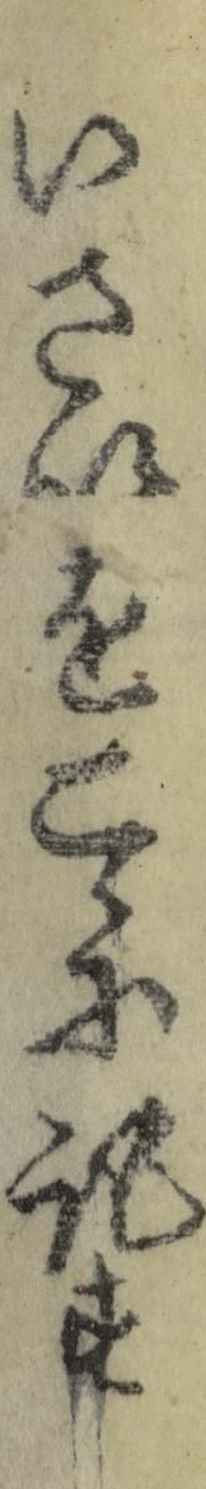いさいをこゝに記す
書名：[安政東南海地震に関する瓦版]
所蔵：東京大学地震研究所図書室 Earthquake Research Institute Library, The University of Tokyo, JAPAN
